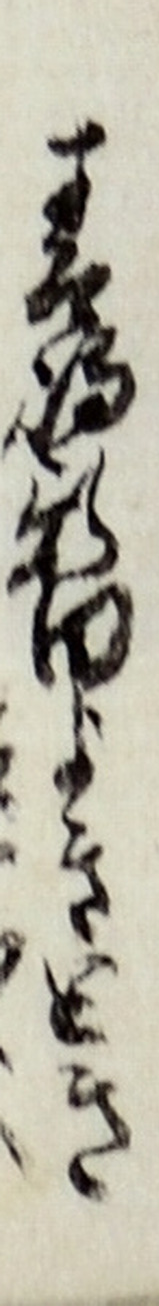春島新田よきとき
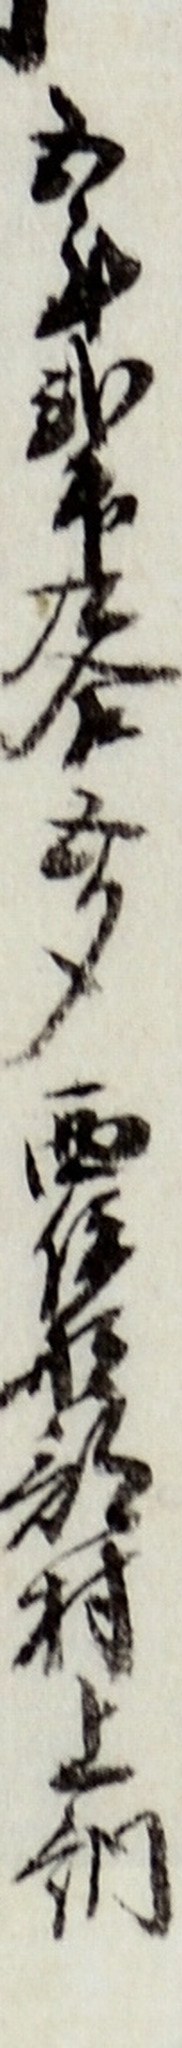五斗弐升九合五勺西伊那部村上納
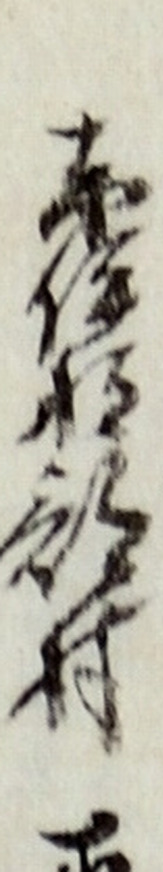西伊那部村
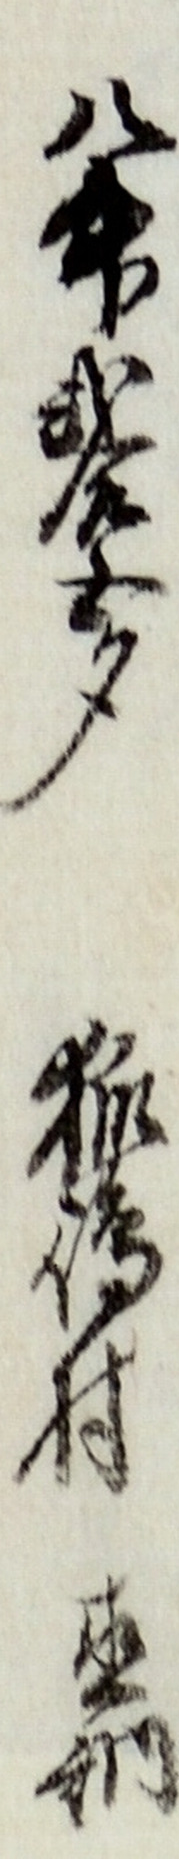八升弐合五勺狐島村直納
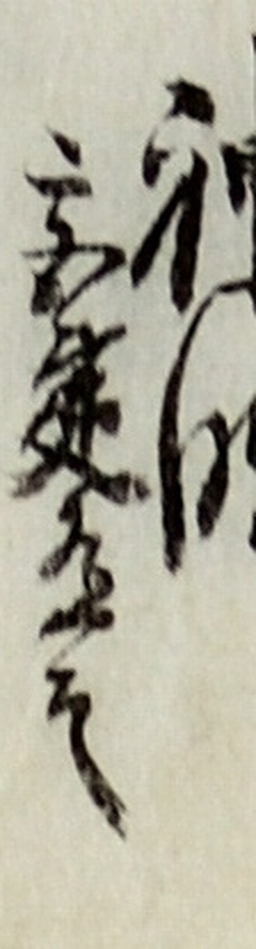宮建有之
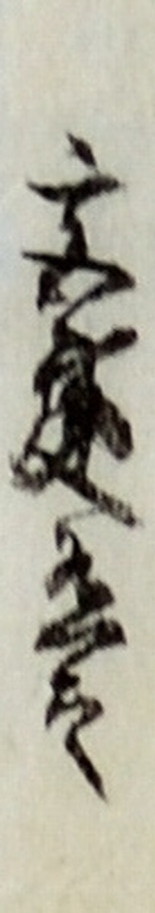宮建有之
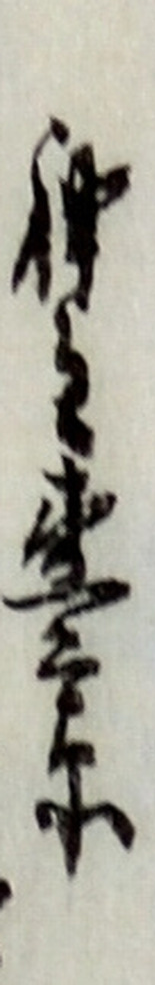杢兵衛
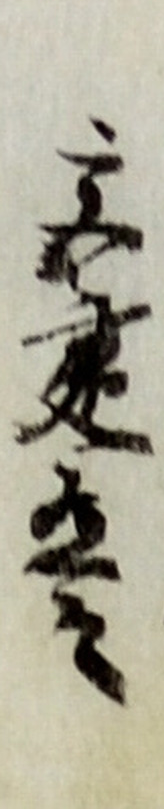宮建有之

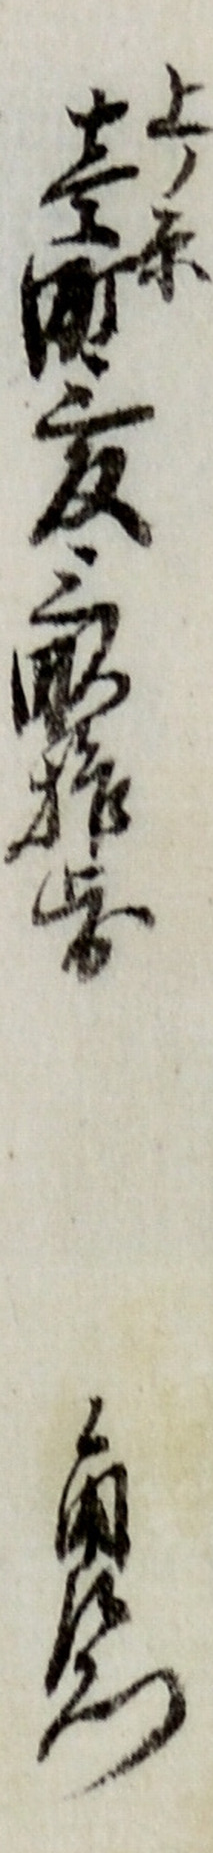壱町三反三畝拾歩角左衛門
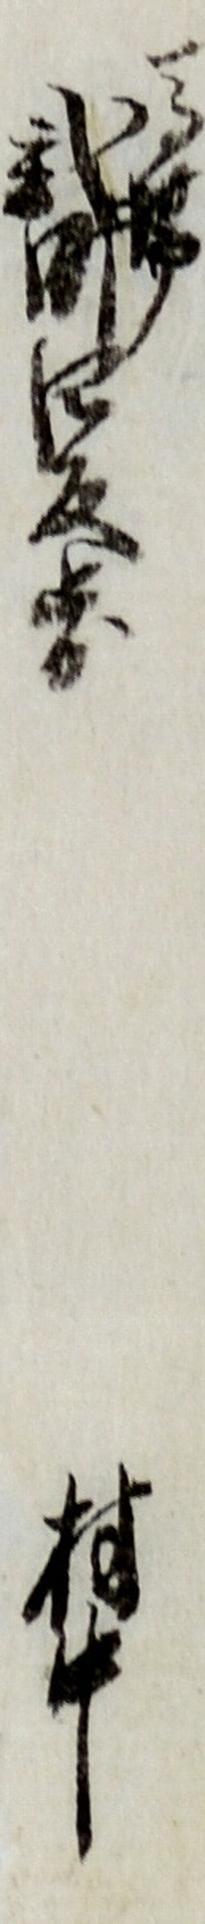弐町四反歩村中
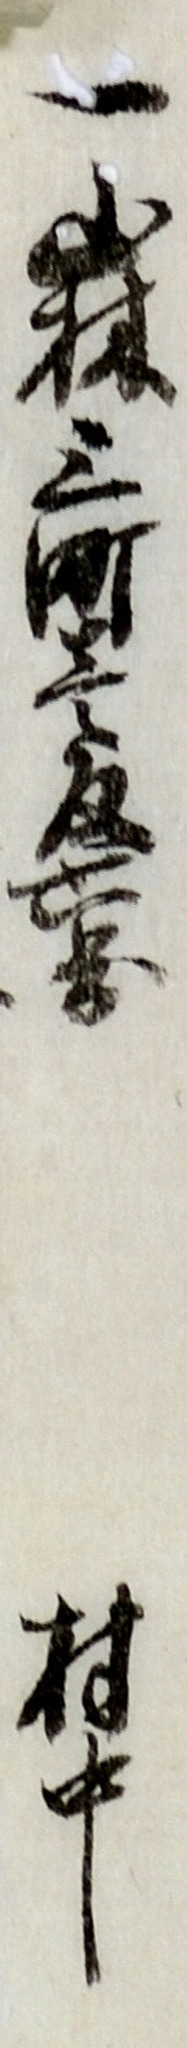一山林三町壱反六歩村中
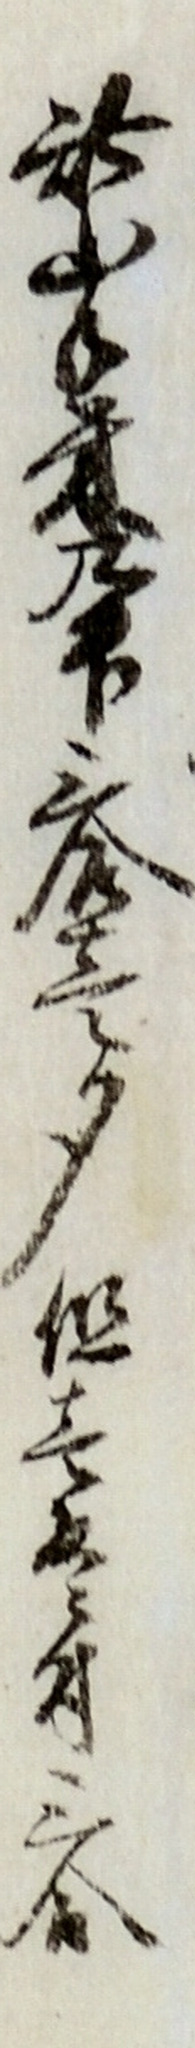此山手米九升三合壱勺但壱反ニ付三合
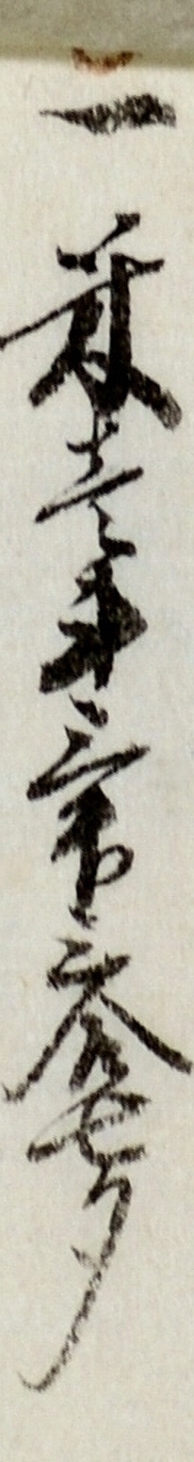一米壱斗三升三合七勺
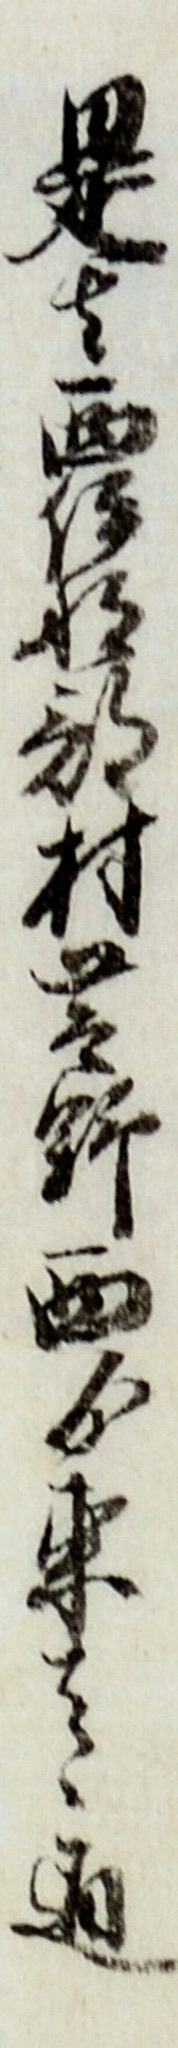是は西伊那部村芝野西より東はゝ通
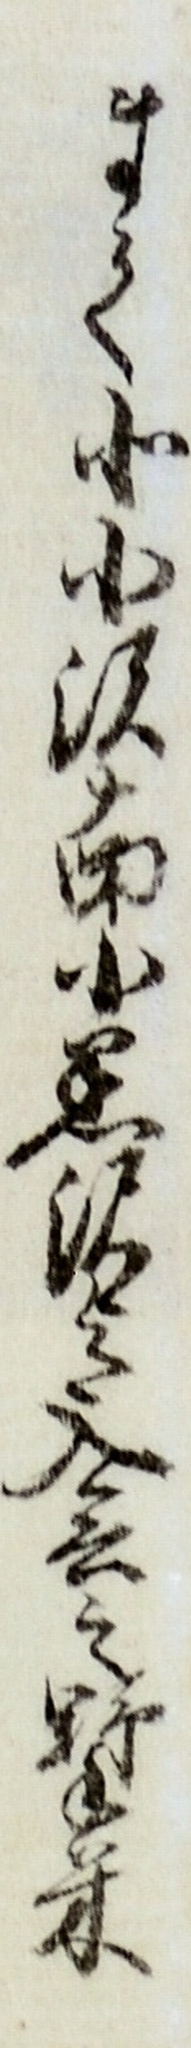まて北小沢南小黒沢迄入会之野手米
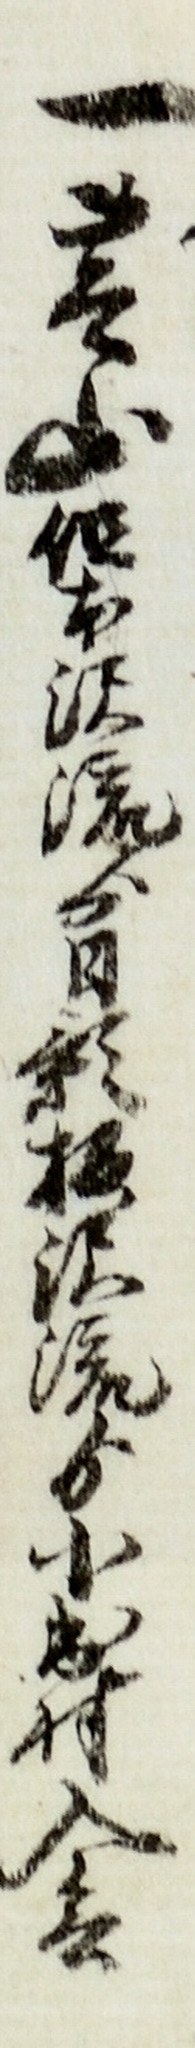一芝山但本沢流より日影板沢流より小出村入会
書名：御領分中山林社地手控
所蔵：伊那市立高遠町図書館・合同会社AMANE
